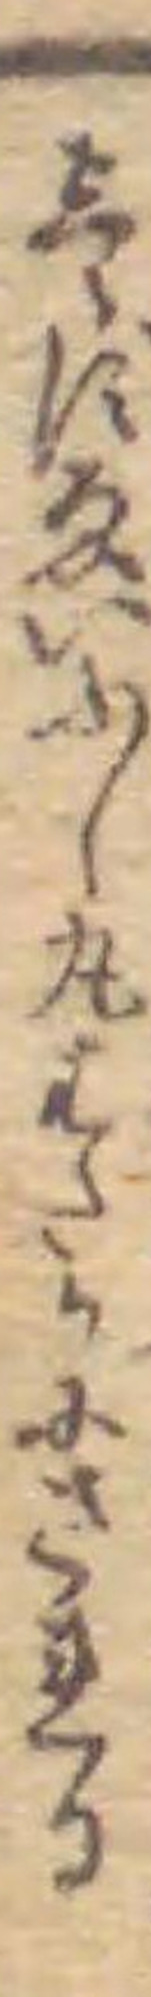しらずゑいふし丸はたかにされる
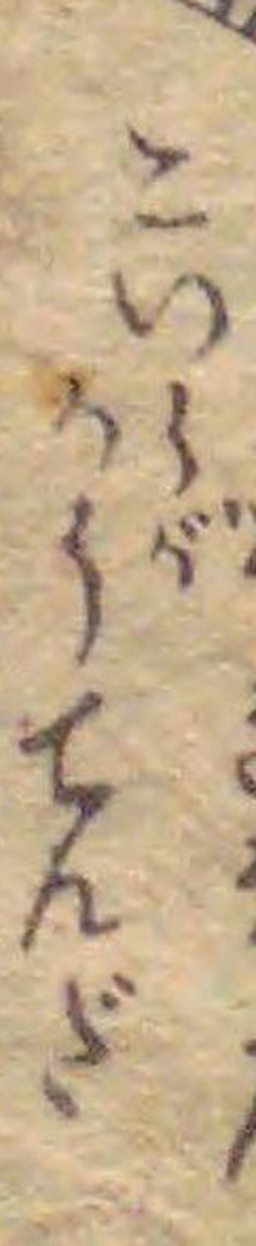かうてんだ

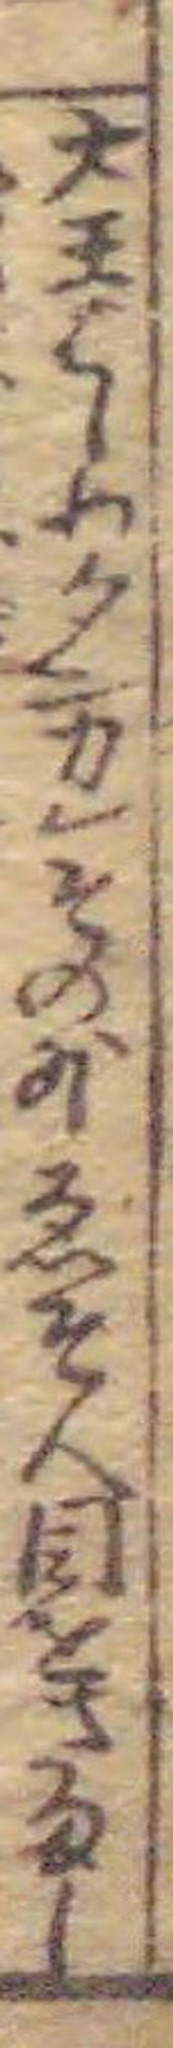大王はしめタンカンその外ゑそ人目をさまし
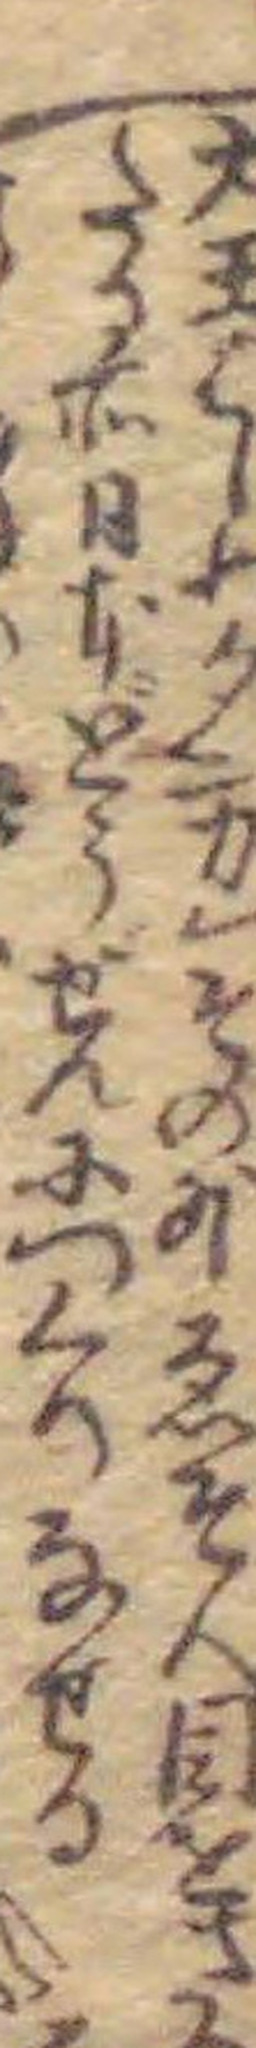たる所日本どうぜんにつくりなせるゑそ
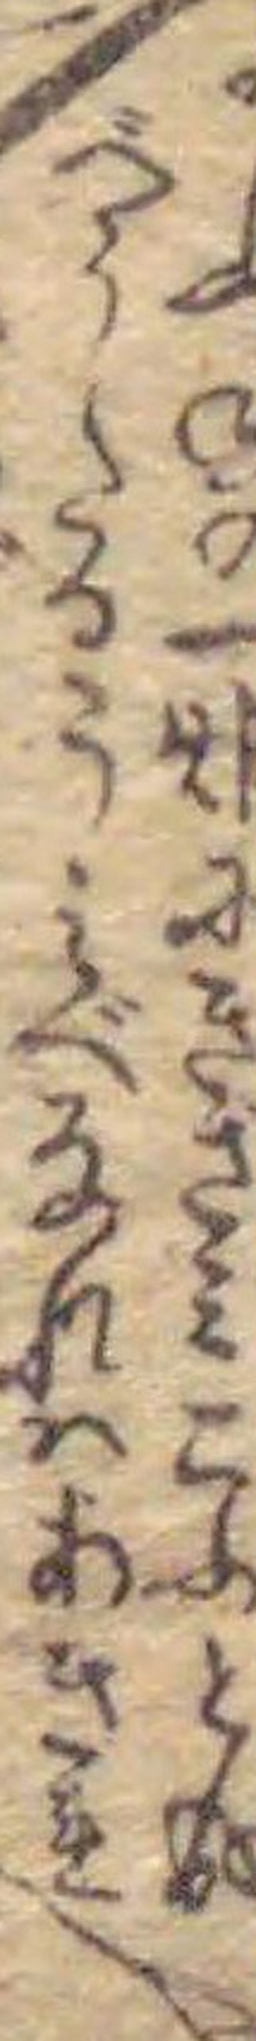べうたるうみべなれはあきれはて
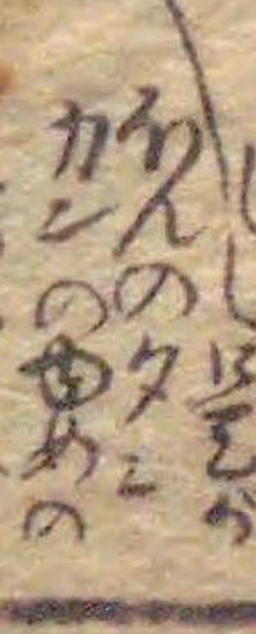カンのゆめの
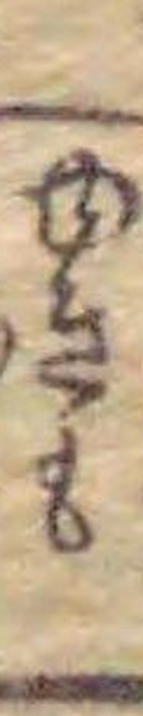ゆきも
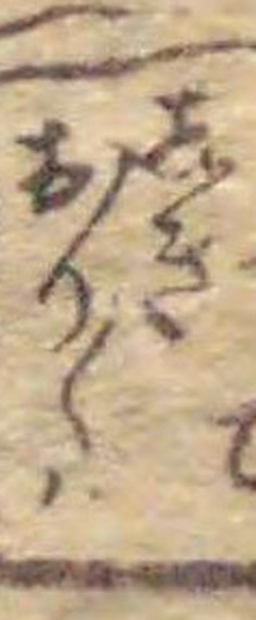おり〳〵は
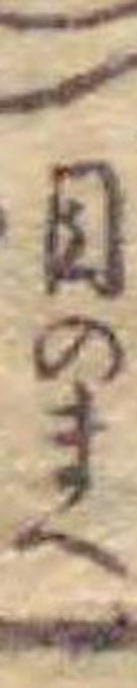目のまへ
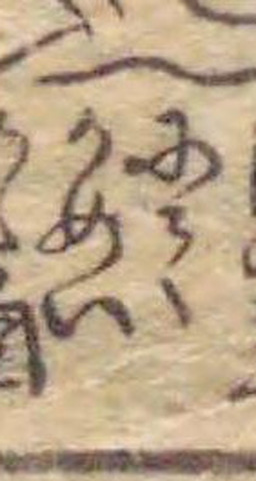かめい
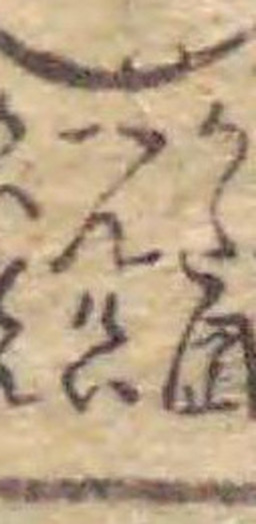へんけい
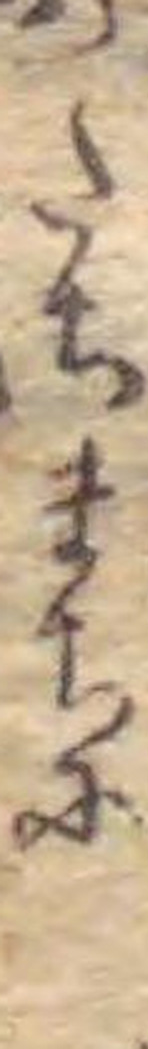たちまちに
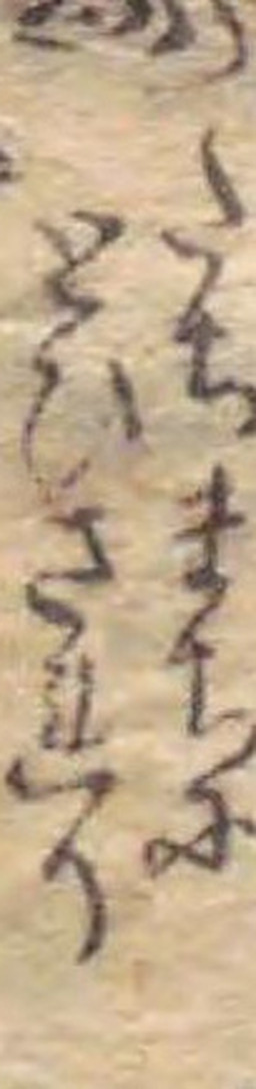とひされり
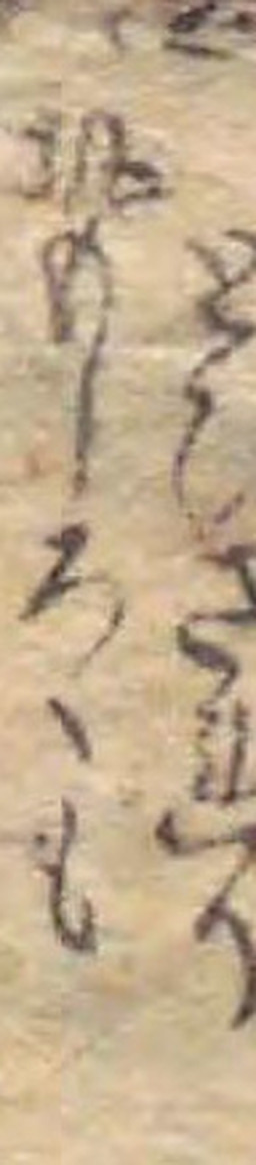おもしろくも
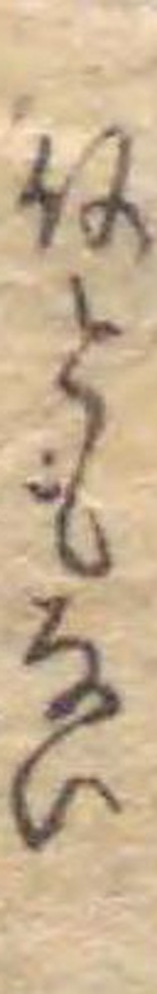何ともない
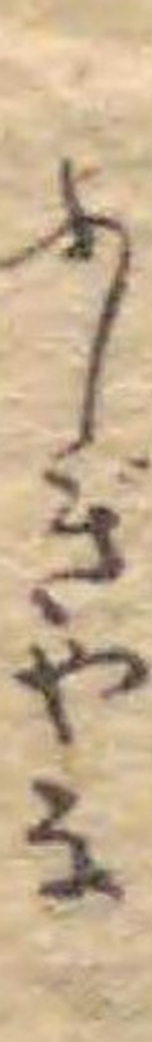ふしぎやな
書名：悦贔負蝦夷押領 : 3巻
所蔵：国立国会図書館 National Diet Library, JAPAN
